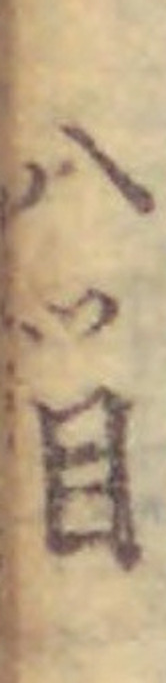八ッ目

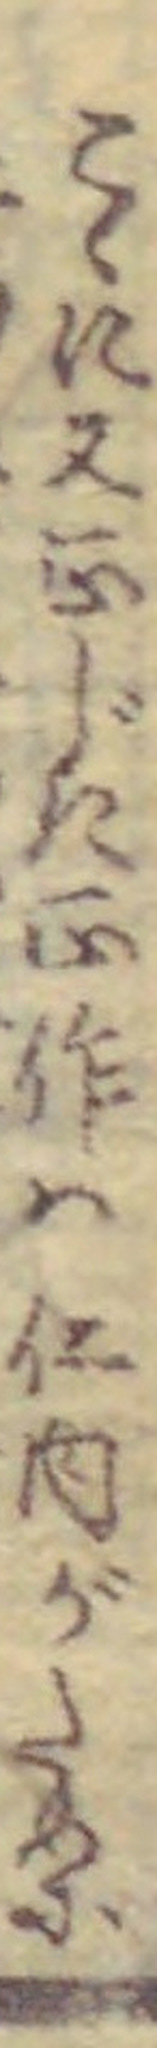こゝに又正じき正作は仁内がために
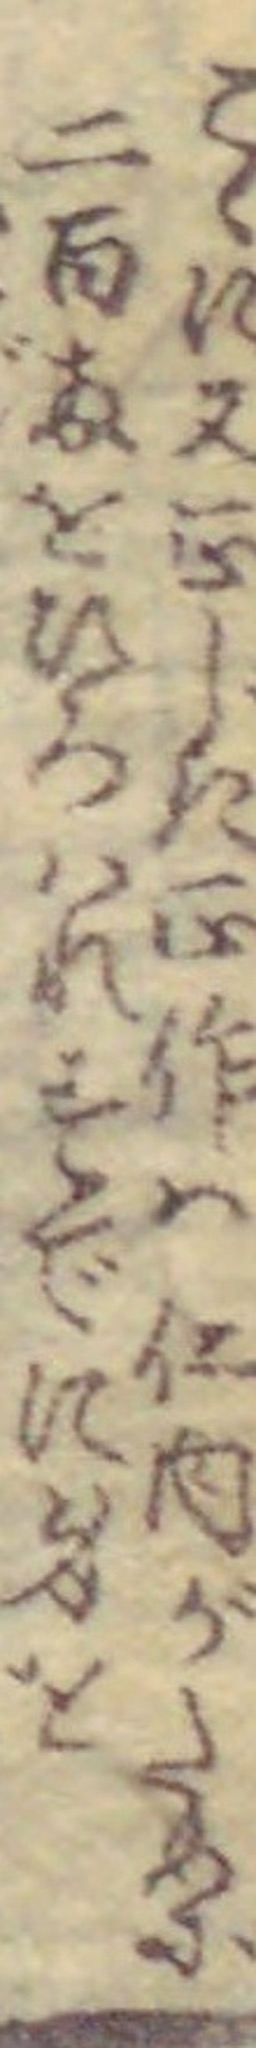二百両をひろはれすでに身を
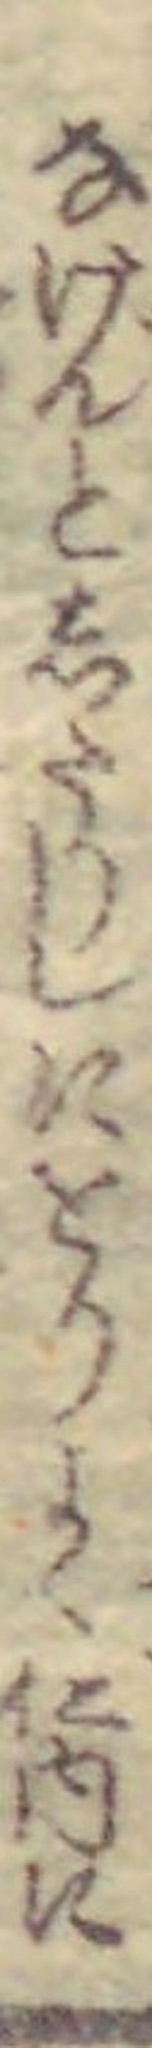なげんとしたりしにをりよく仁内に
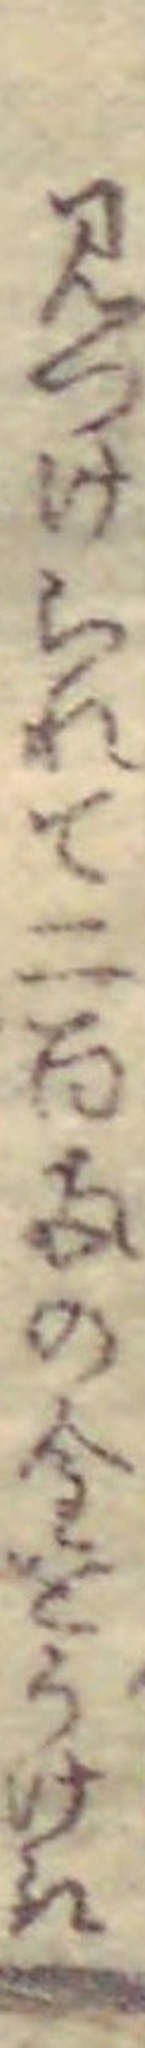見つけられて二百両の金をうけ取
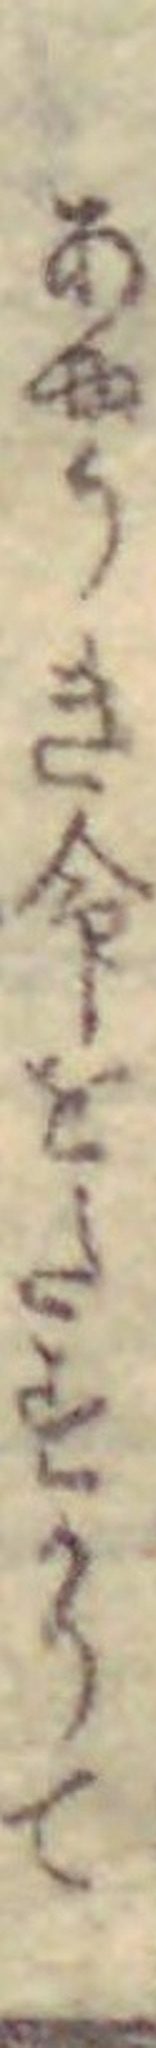あやうき命をたすかりて
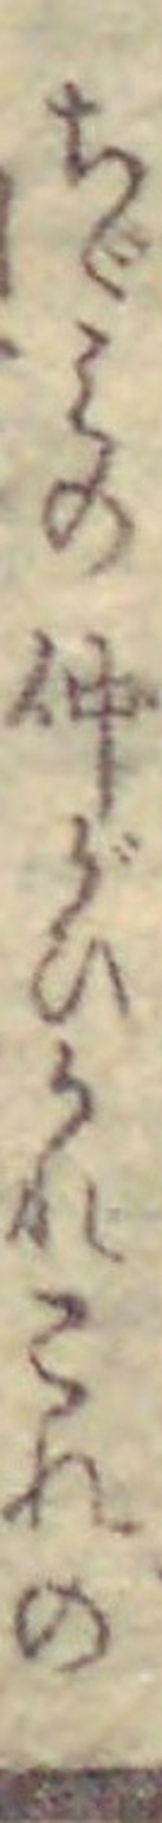ちゞみの仲がひかれこれの
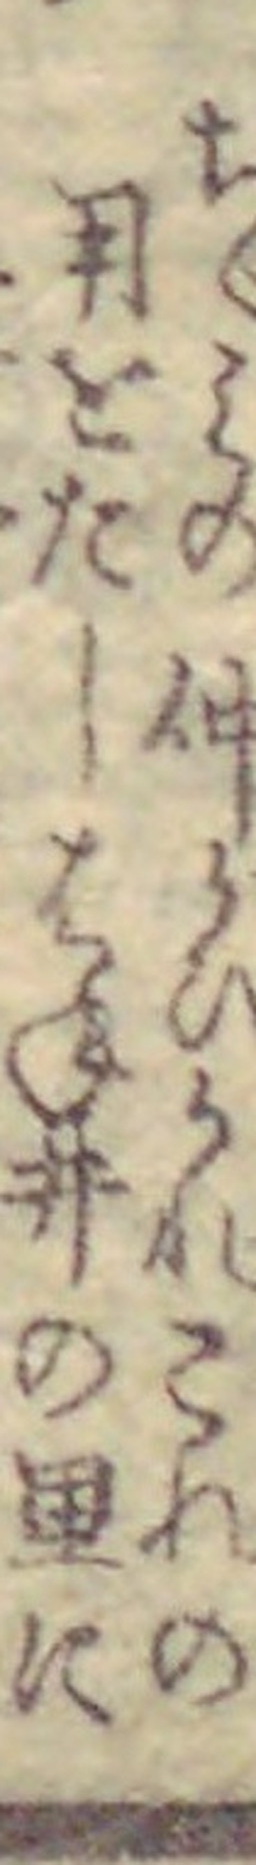用をたしはね井の里に
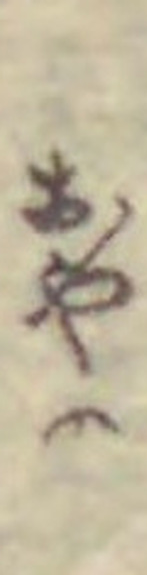おやの
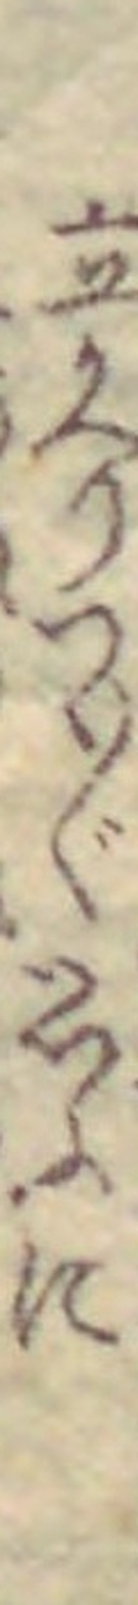立かへりつく〴〵思ふに
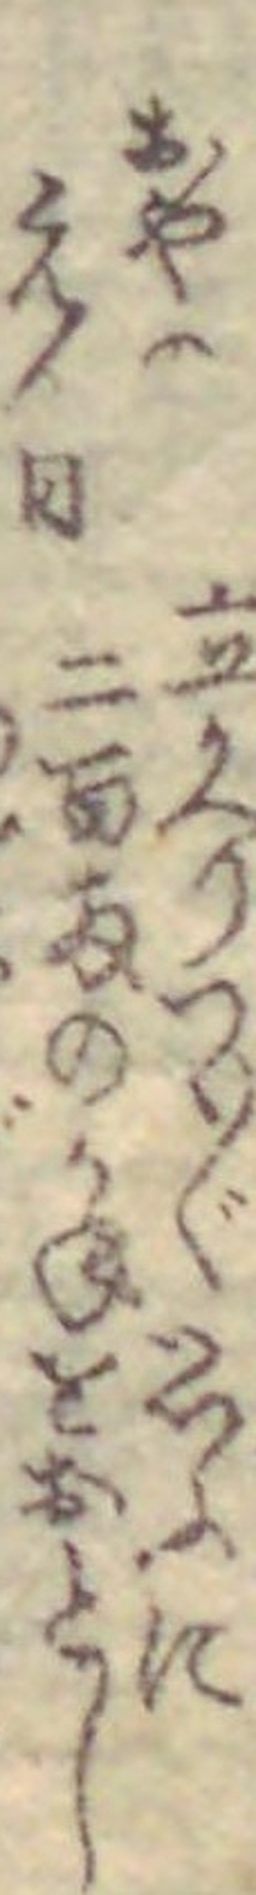二百両のかねをおとし
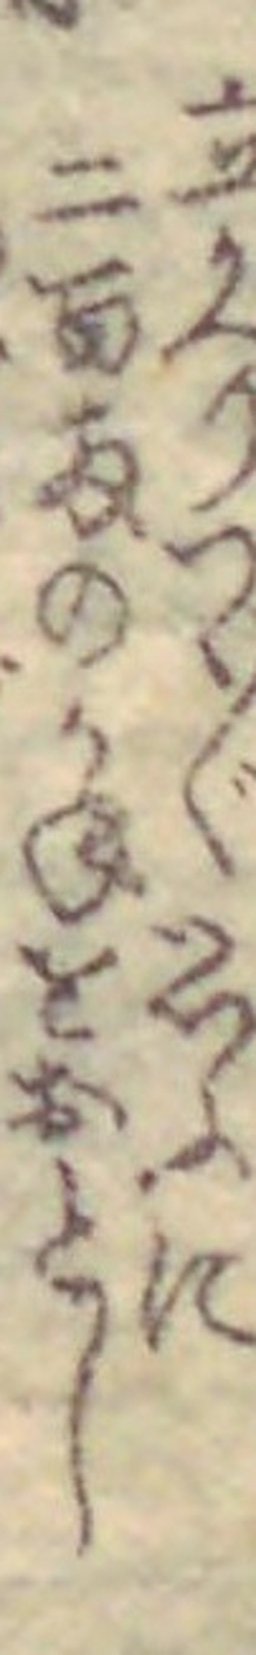二百両のかねをおとし
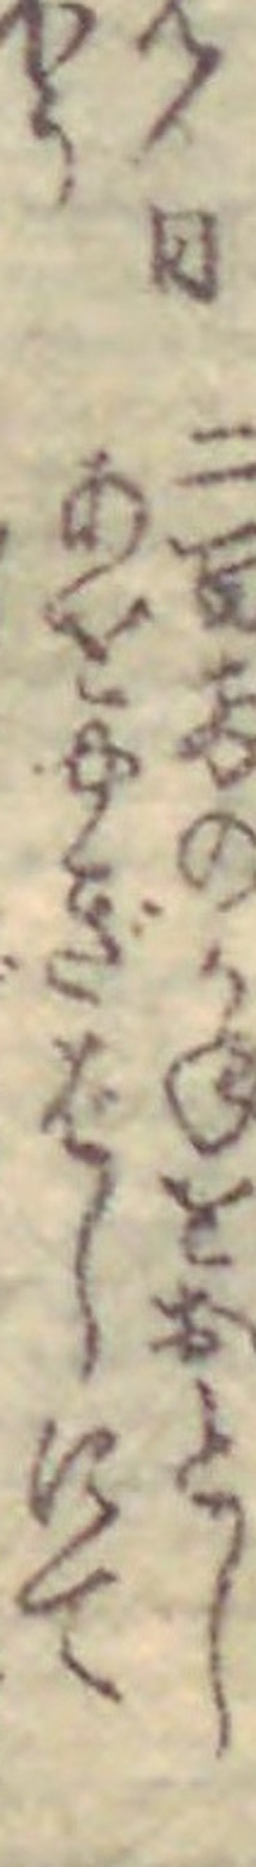あをやぎばしにて
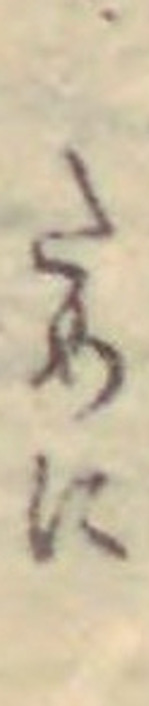ために
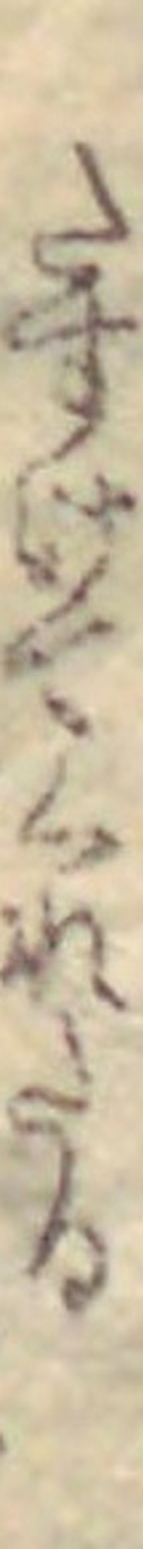たすけてくれたる
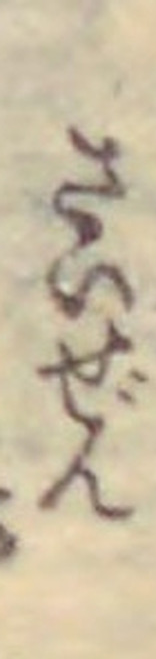さいぜん
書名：八ツ目鱣因縁物語 3巻
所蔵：国立国会図書館 National Diet Library, JAPAN
